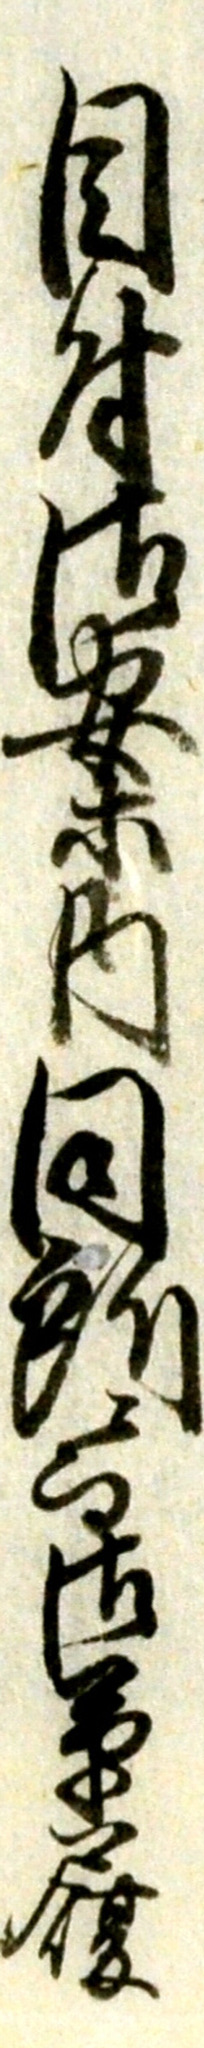目付御案内同所ニ而御草履
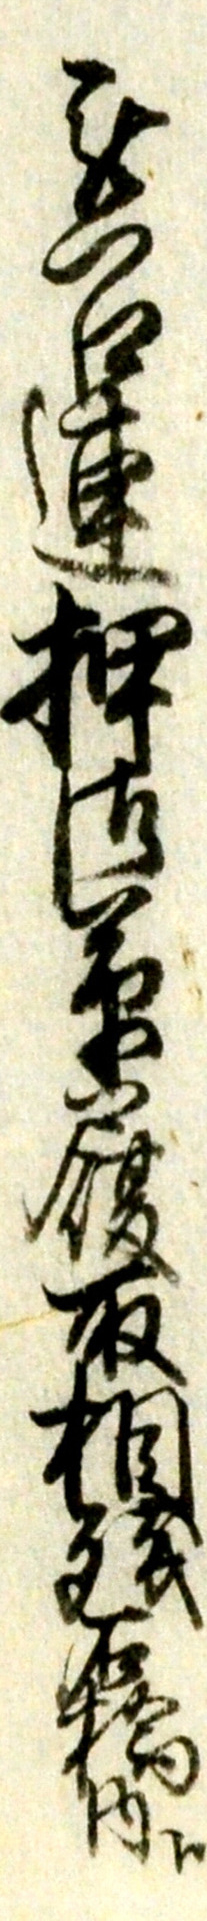被召連押御草履取相残石橋内え
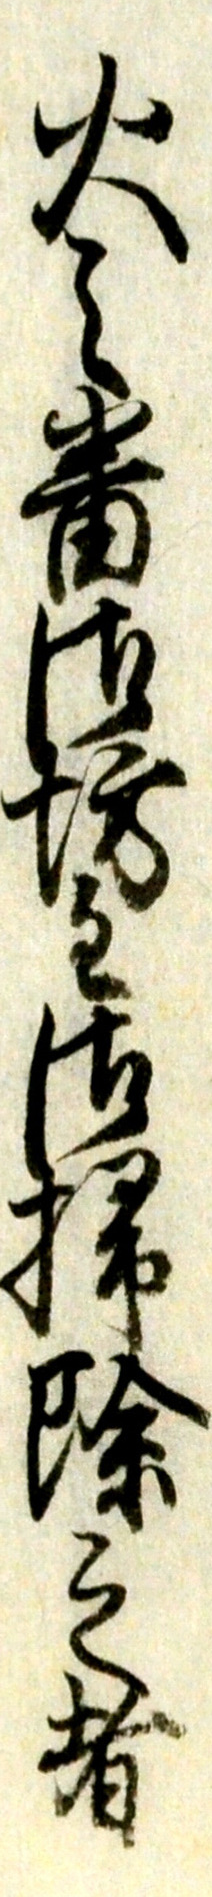火之番御坊主御掃除之者
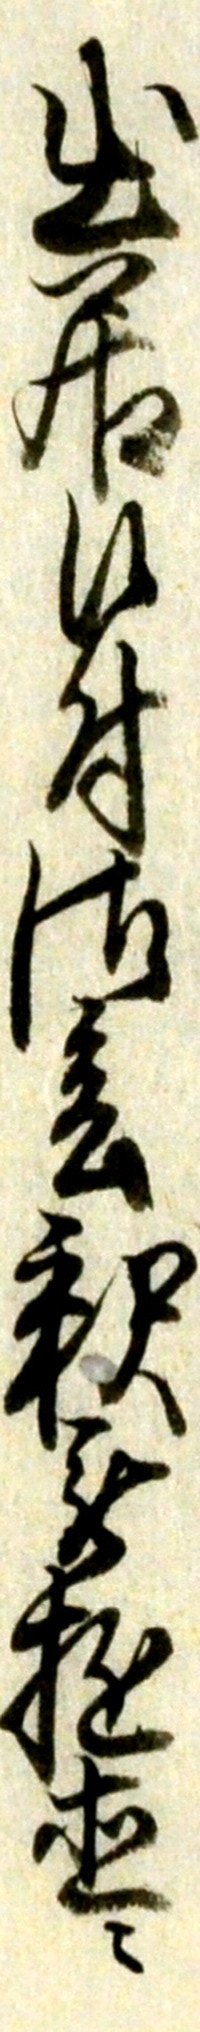出居候付御会釈被遊直ニ
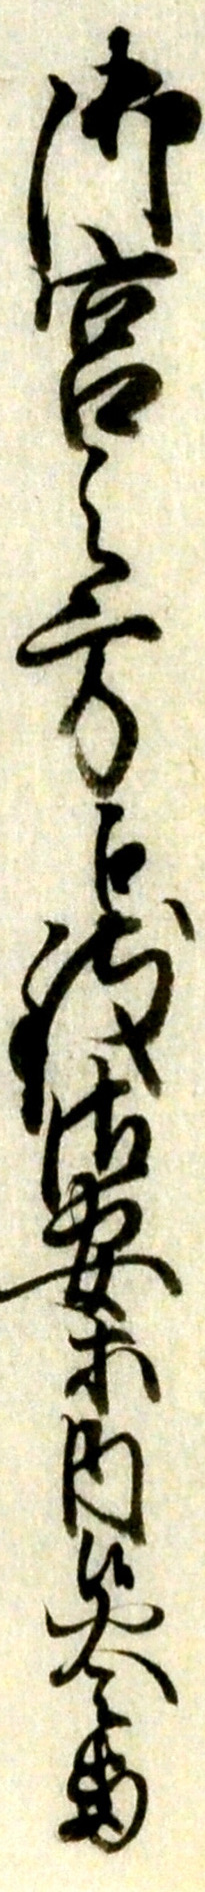御宮之方え致御案内候火之番
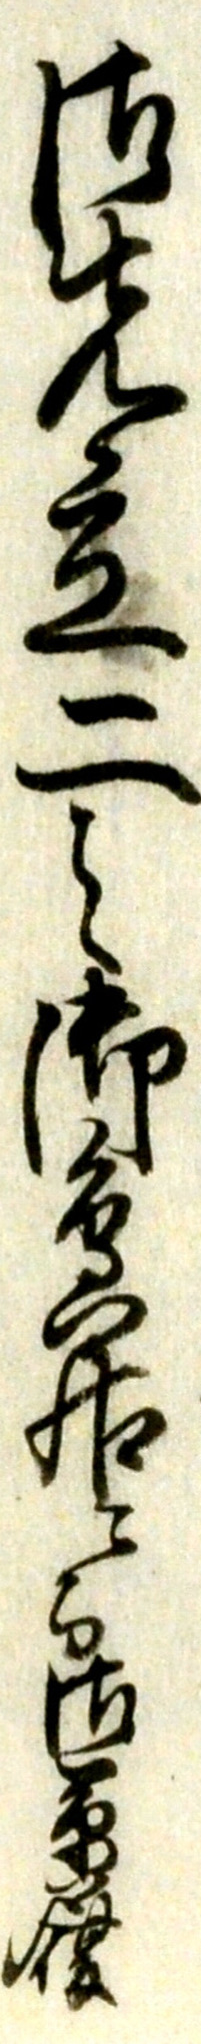御先立二之御鳥居ニ而御草履
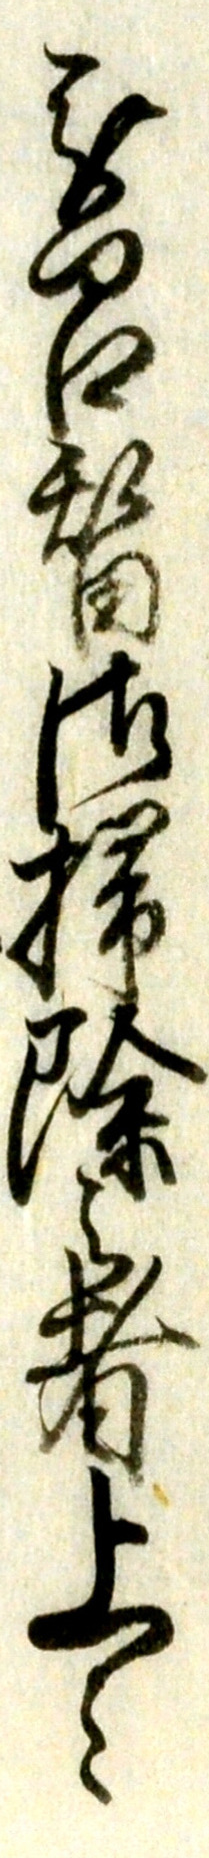被召替御掃除之者上之
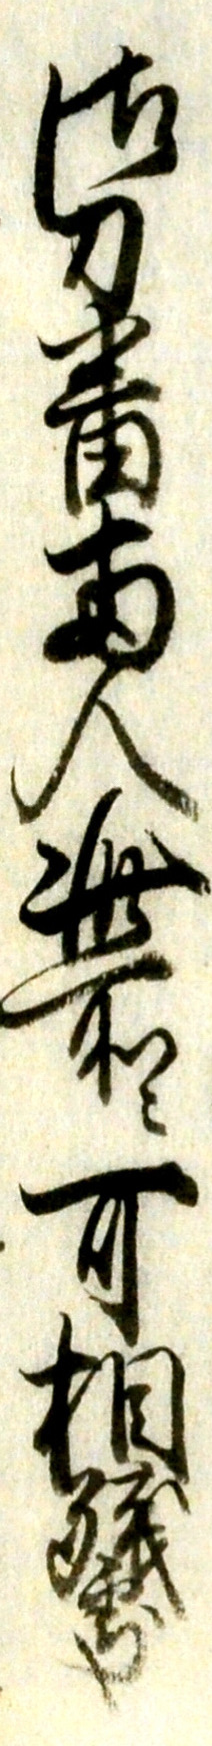御刀番両人此所ニ可相残処へ
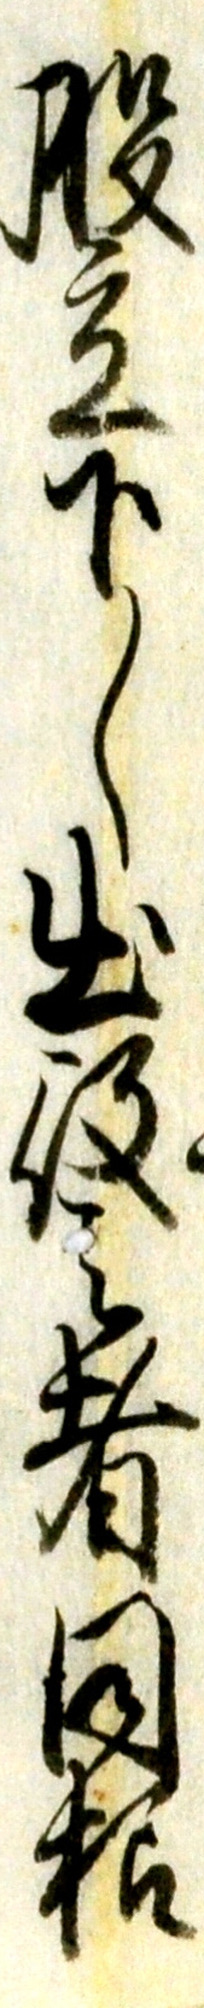股立下〳〵出役之者同様
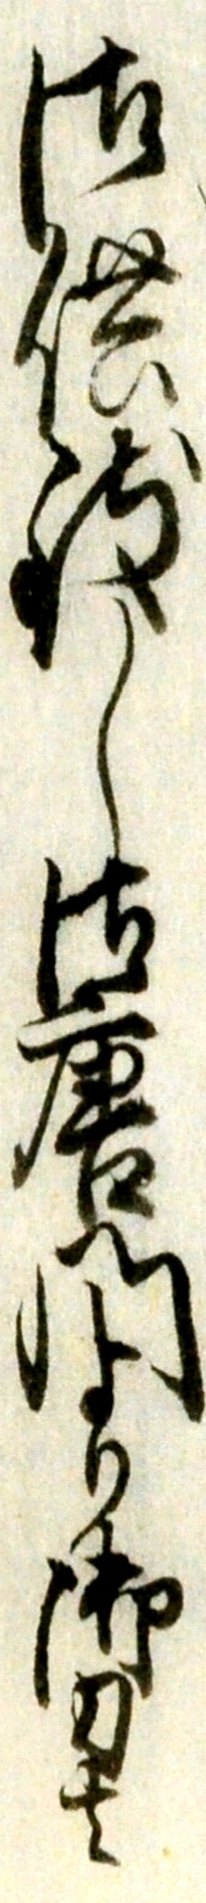御供致し御唐門より御刀は
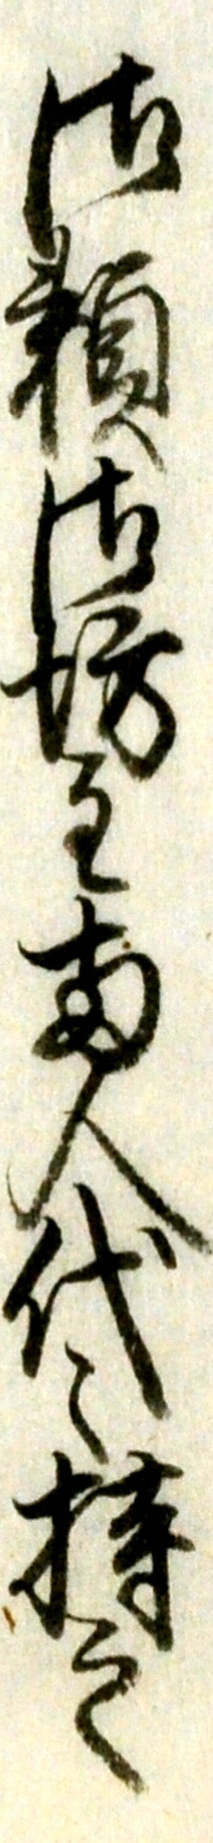御頼御坊主両人代々持之
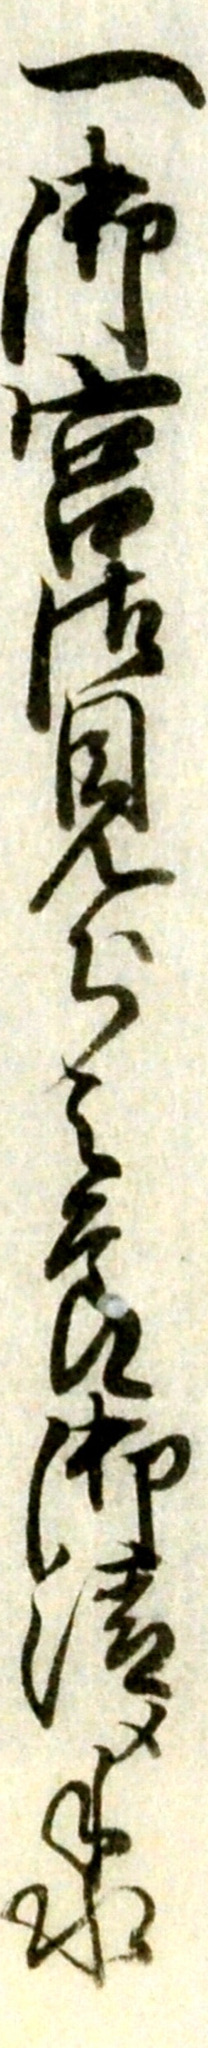一御宮御見分之節御清メ手水
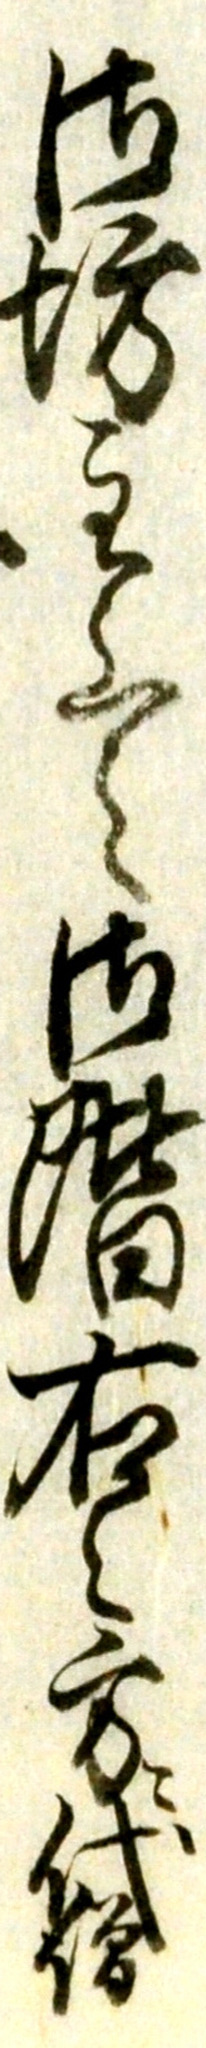御坊主上之御階右之方ニ代僧
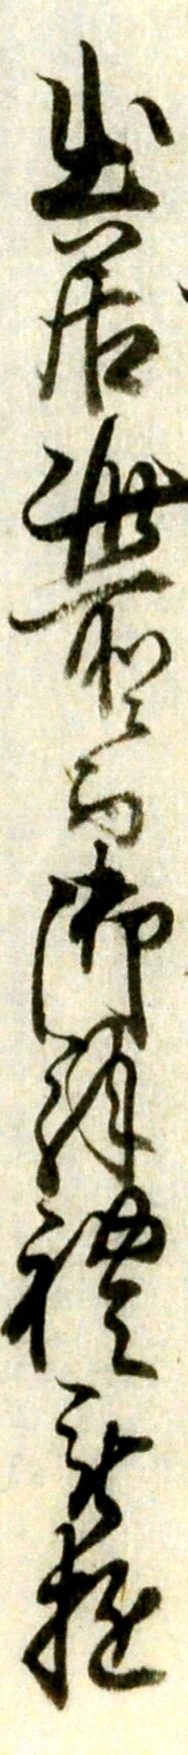出居此所ニ而御拝礼被遊

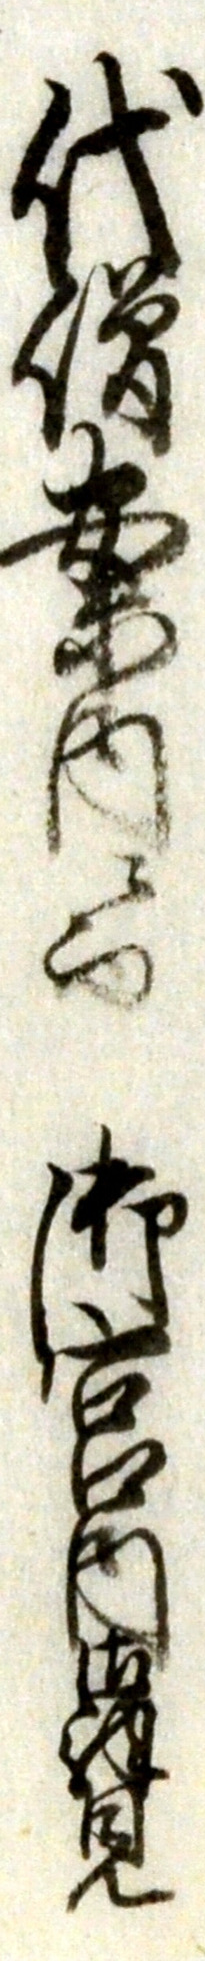代僧案内ニ而御宮内御拝見
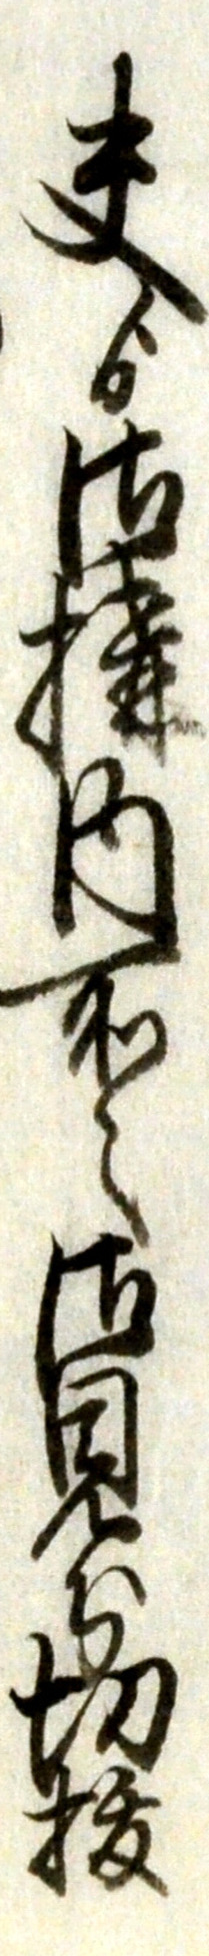夫ゟ御構内所々御見分切抜
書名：紅葉山御見分ノ節ノ御書付
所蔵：伊那市立高遠町図書館・合同会社AMANE
